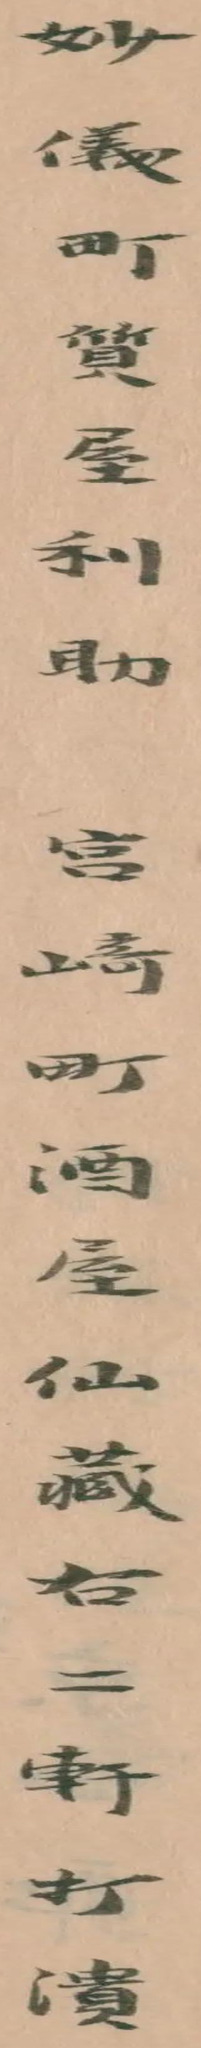妙儀町質屋利助宮崎町酒屋仙蔵右二軒打潰
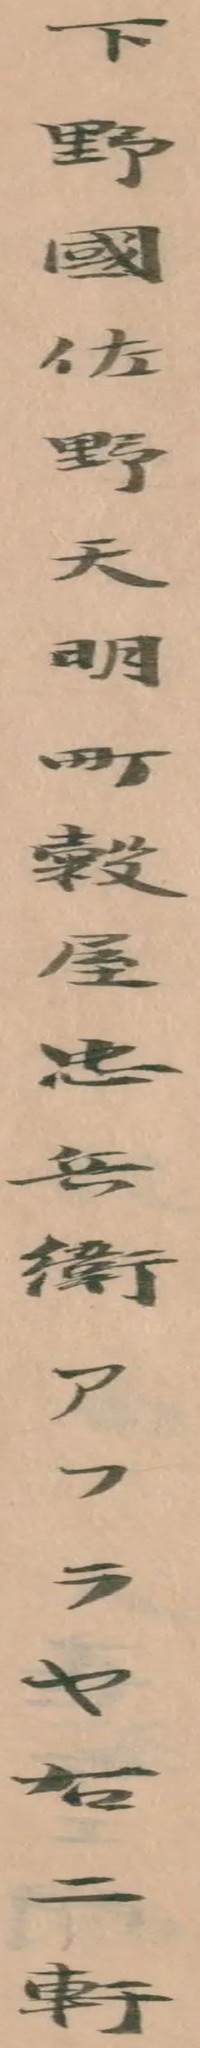下野国佐野天明町穀屋忠兵衛アフラヤ右二軒
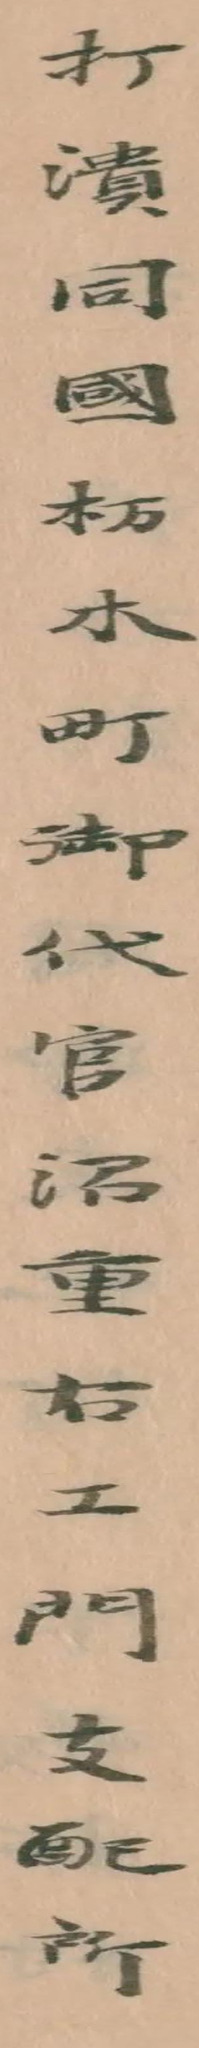打潰同国板木町御代官沼重右衛門支配所
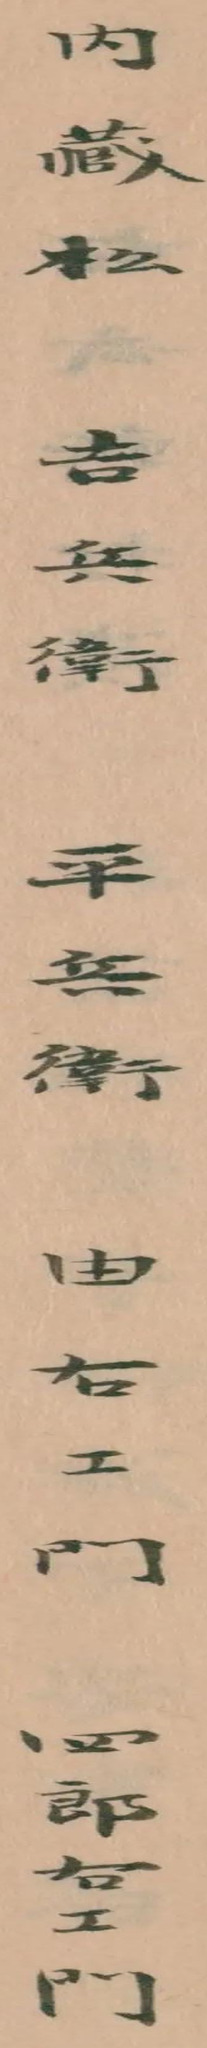内蔵松吉兵衛平兵衛由右衛門四郎右衛門
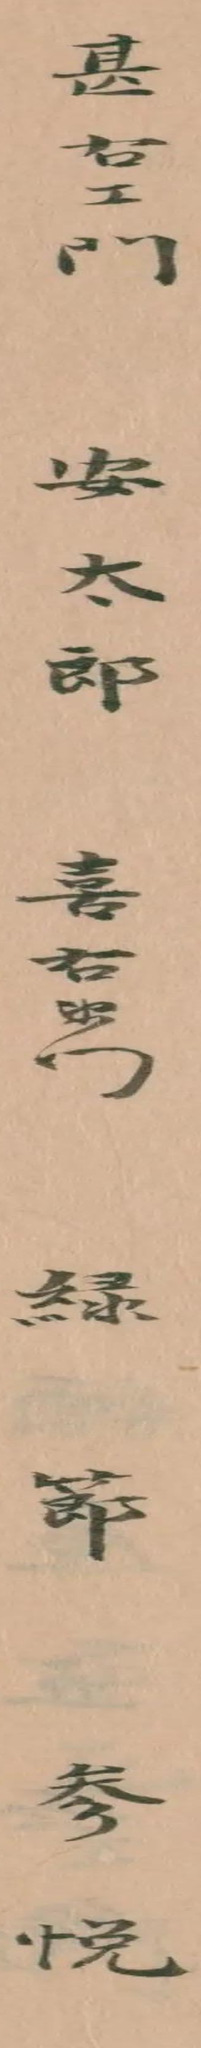甚右衛門安太郎喜右衛門緑節参悦
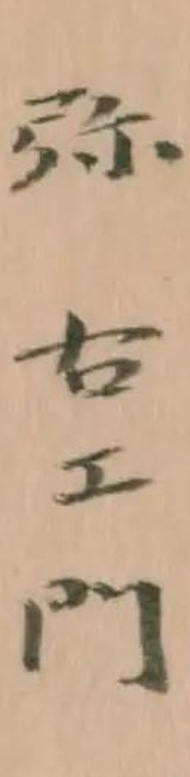弥右衛門
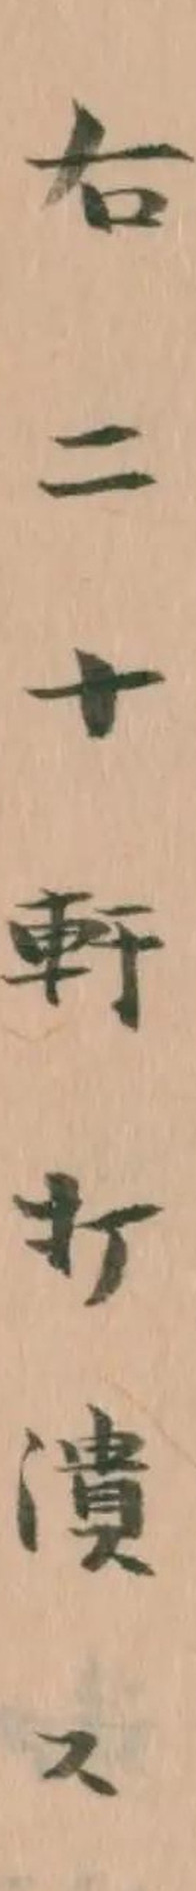右二十軒打潰ス
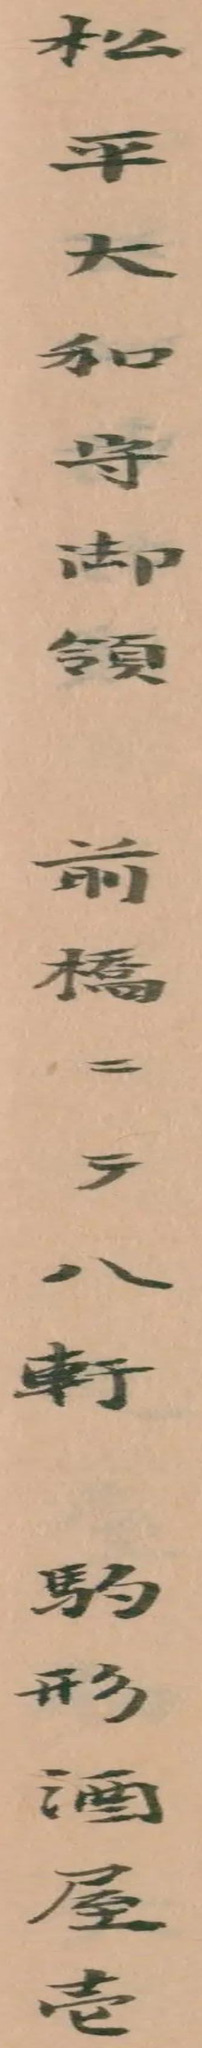松平大和守御領前橋ニテ八軒駒形酒屋壱
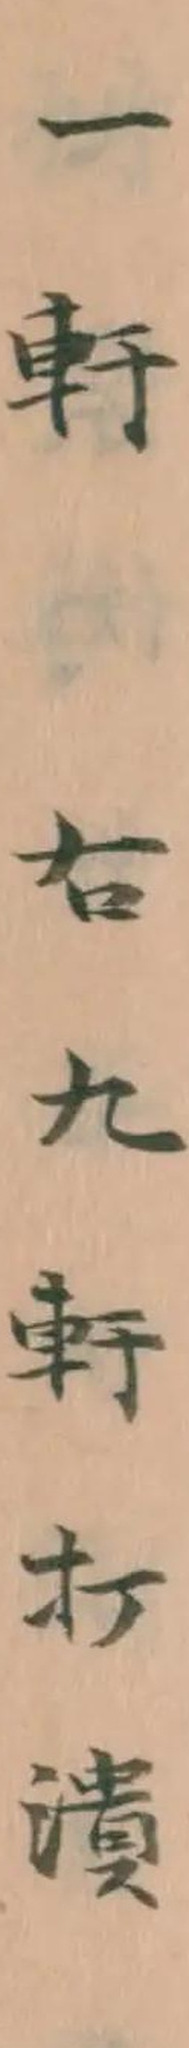一軒右九軒打潰
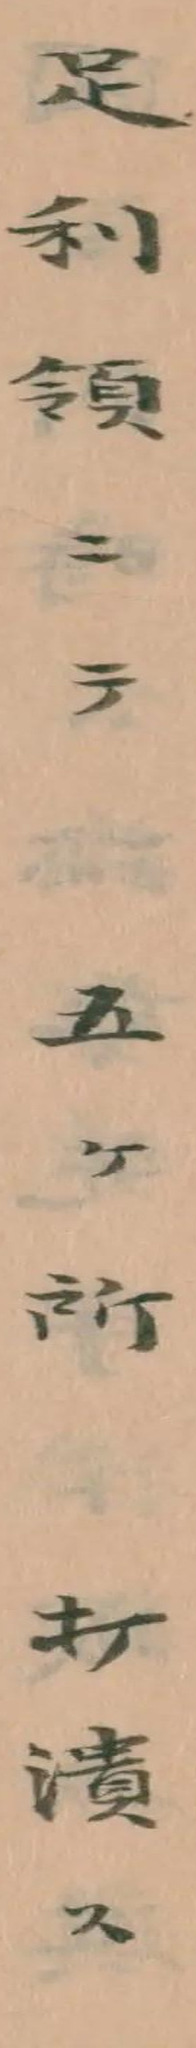足利領ニテ五ヶ所打潰ス
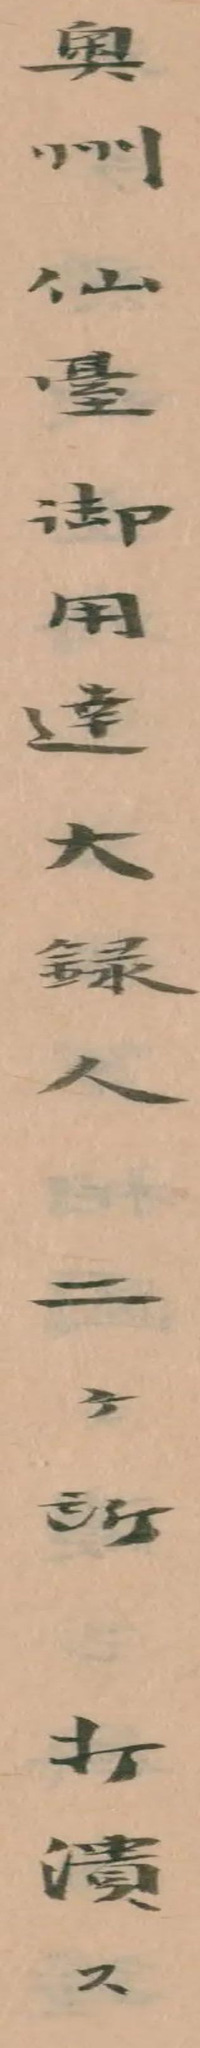奥州仙台御用達大録人二ヶ所打潰ス
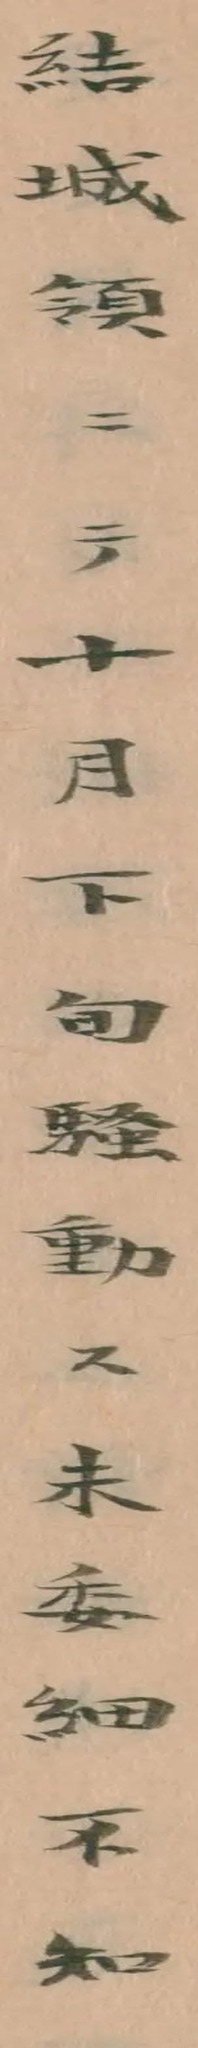結城領ニテ十月下旬騒動ス未委細不知
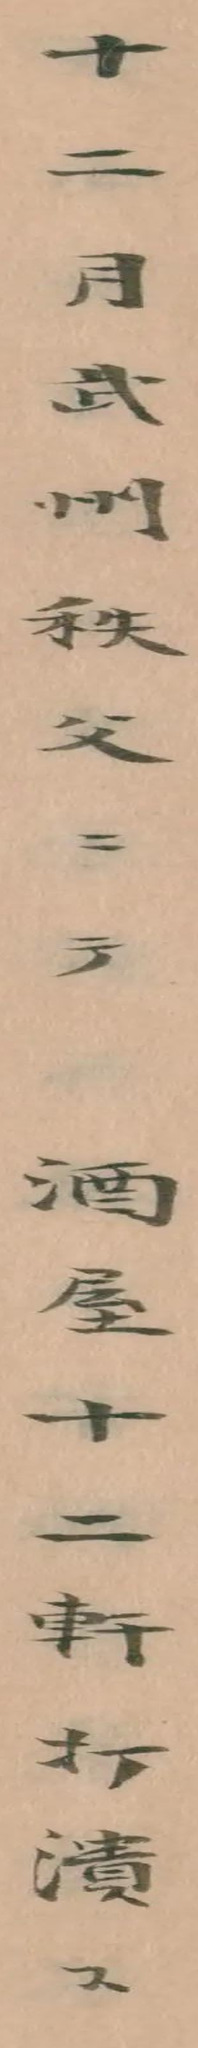十二月武州秩父ニテ酒屋十二軒打潰ス
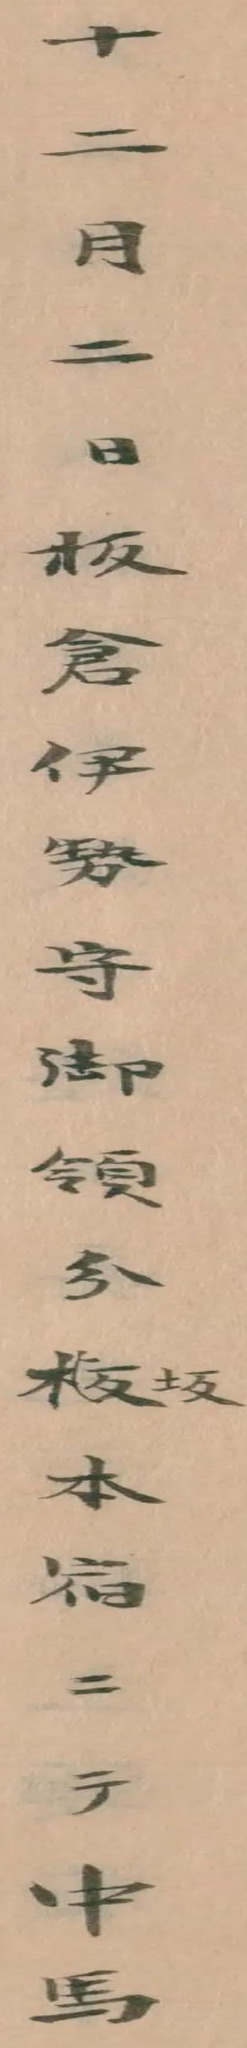十二月二日板倉伊勢守御領分坂本宿ニテ中馬
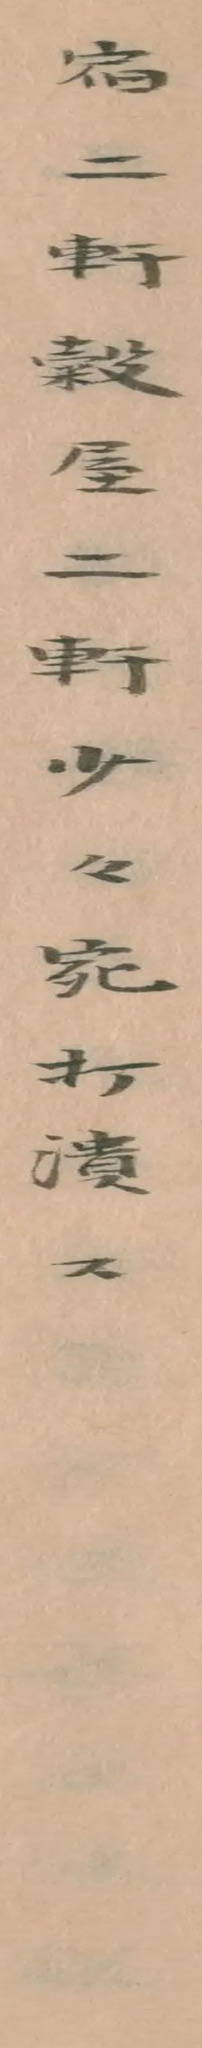宿二軒穀屋二軒少々宛打潰ス
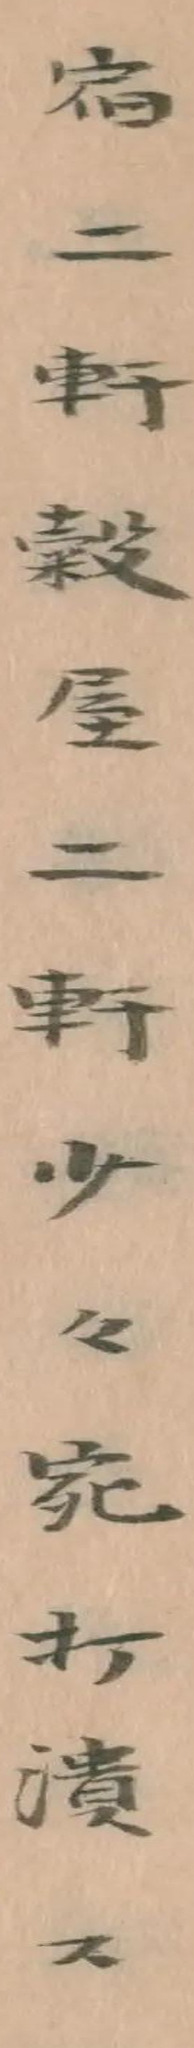宿二軒穀屋二軒少々宛打潰ス
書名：地災撮要. 巻3(地震之部)-巻4(噴火之部)
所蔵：国立国会図書館 National Diet Library, JAPAN
